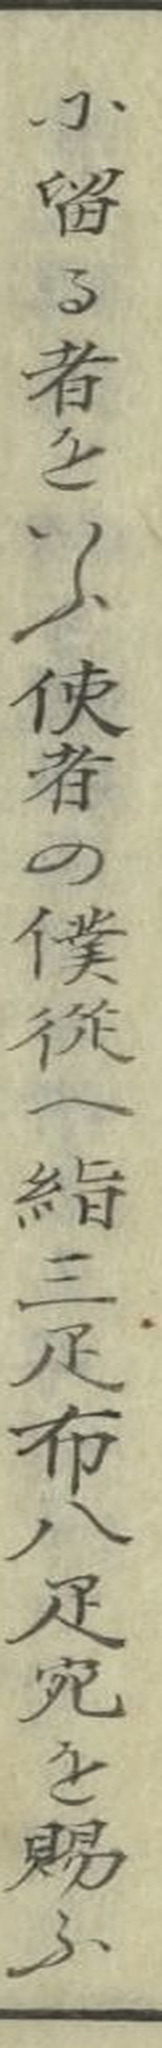に留る者をいふ使者の僕従へ三疋布八疋宛を賜ふ
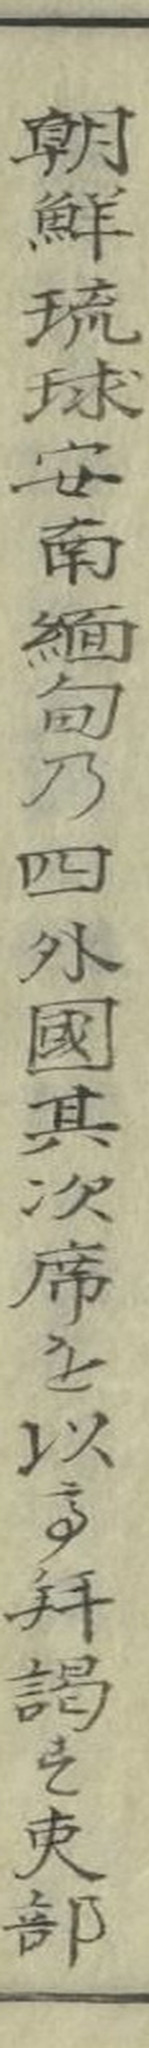朝鮮琉球安南緬旬の四外国其次席を以て拝謁す吏部
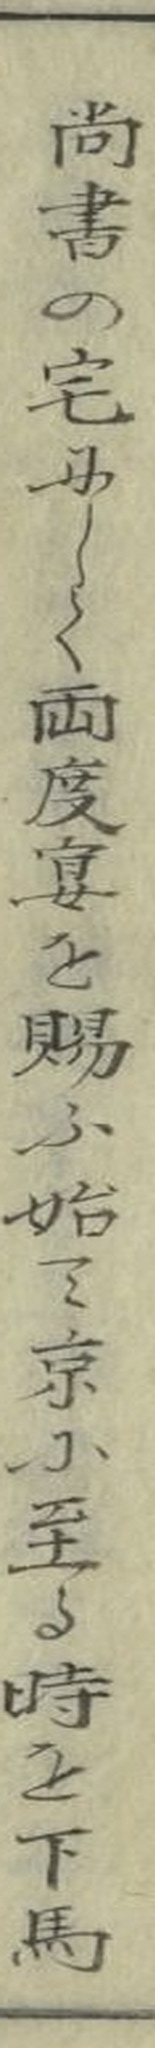尚書の宅にして両度宴を賜ふ始て京に至る時を下馬
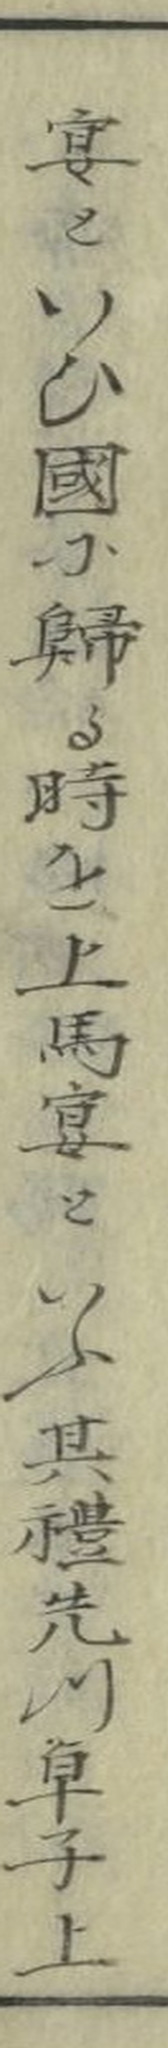宴といひ国に帰る時を上馬宴といふ其礼先つ卓子上

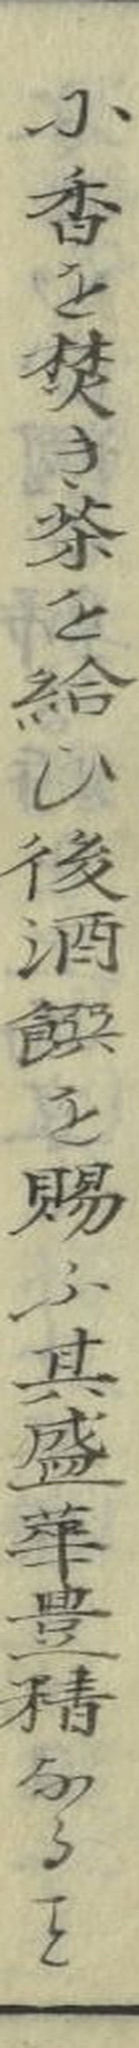に香を焚き茶を給ひ後酒饌を賜ふ其盛華豊精なること
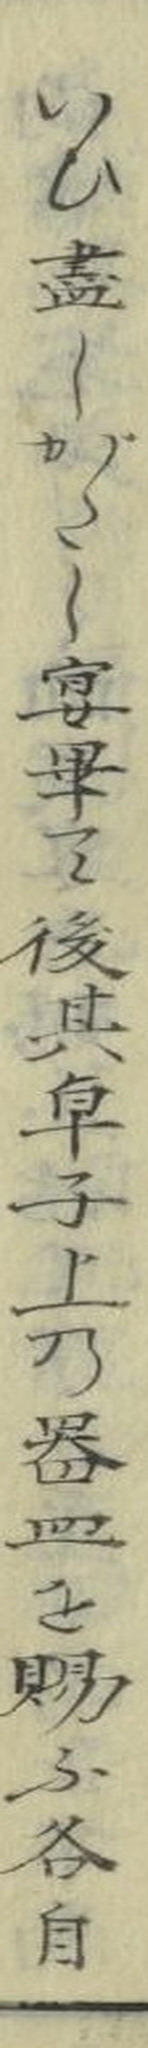いひ尽しがたし宴畢て後其卓子上の器皿を賜ふ各自
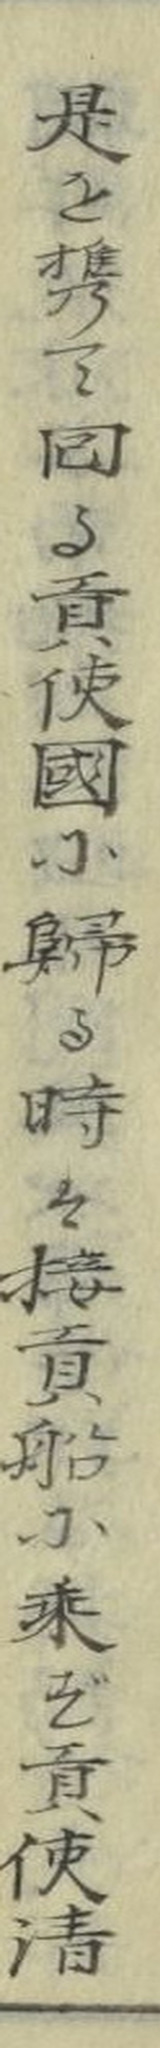是を携て回る貢使国に帰る時は接貢船に乗ず貢使清
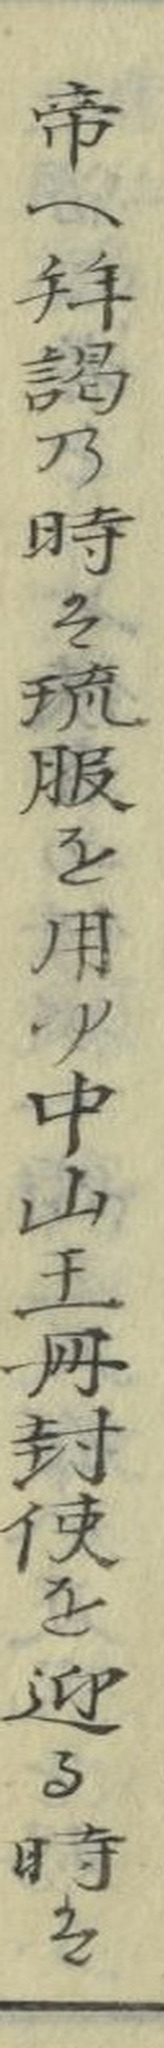帝へ拝謁の時は琉服を用ゆ中山王冊封使を迎る時は
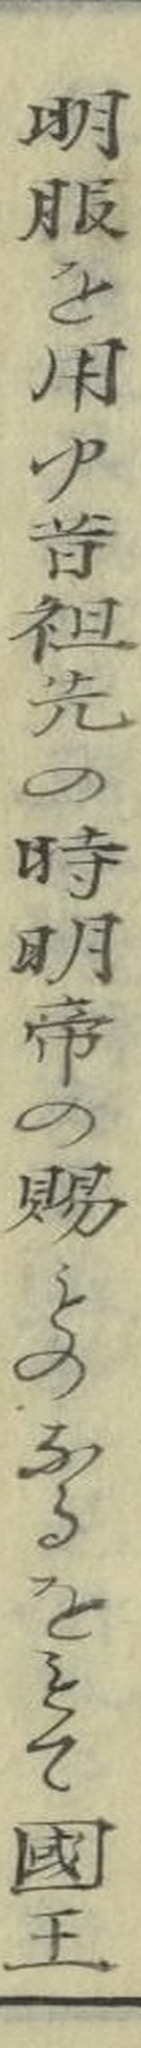明服を用ゆ昔祖先の時明帝の賜ものなるをもて国王
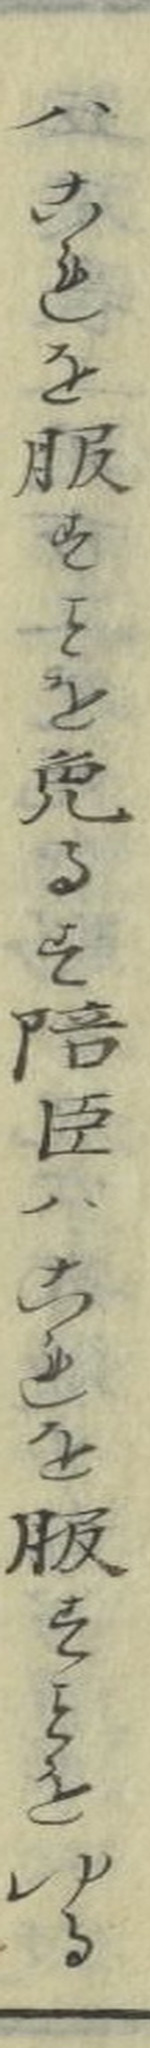はこれを服すことを免るす陪臣はこれを服すことをゆる
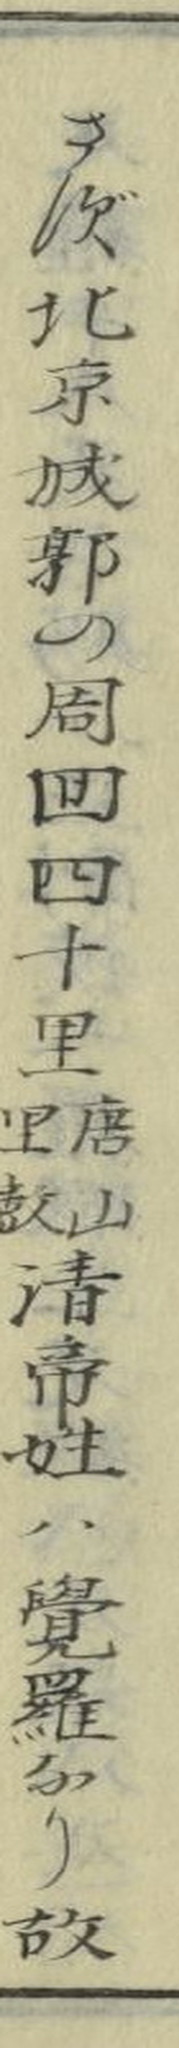さず北京城郭の周囲四十里唐山里数清帝姓は覚羅なり故
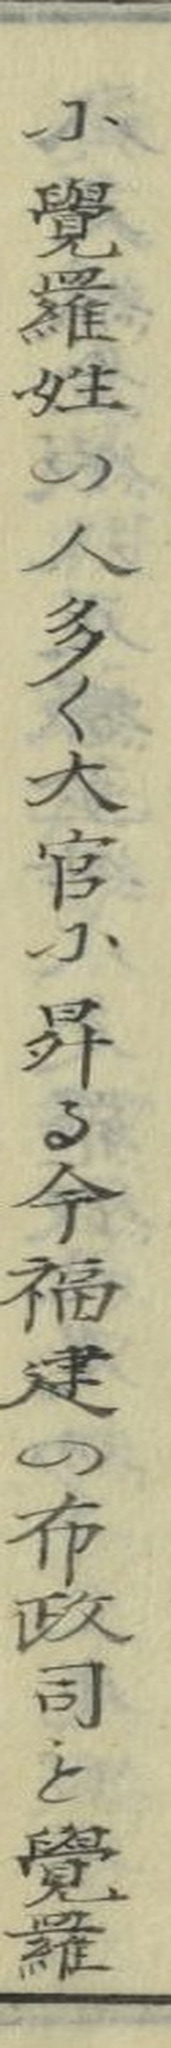に覚羅姓の人多く大官に昇る今福建の布政司も覚羅
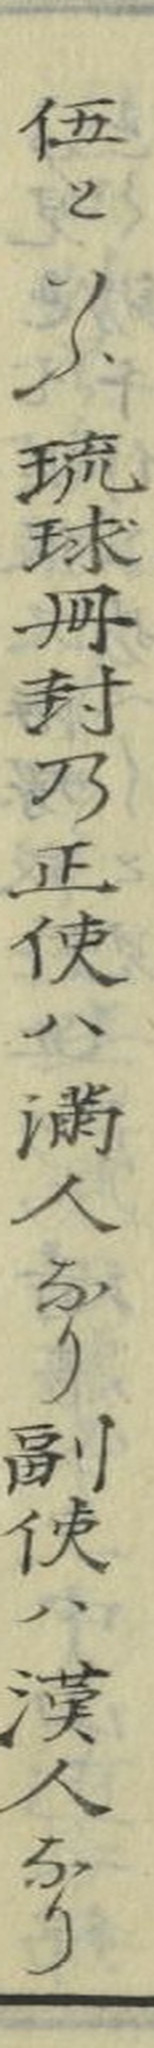伍といふ琉球冊封の正使は満人なり副使は漢人なり
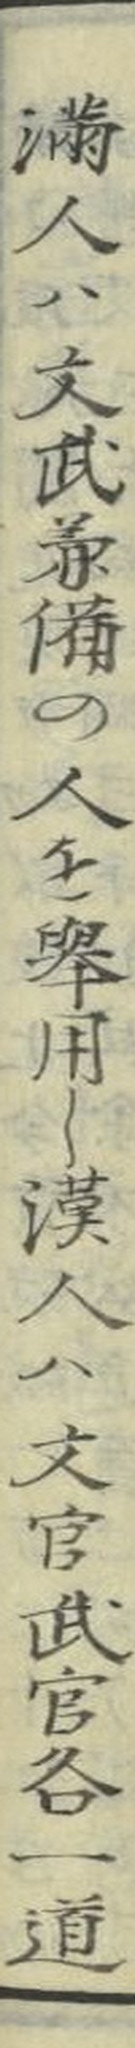満人は文武兼備の人を挙用し漢人は文官武官各一道
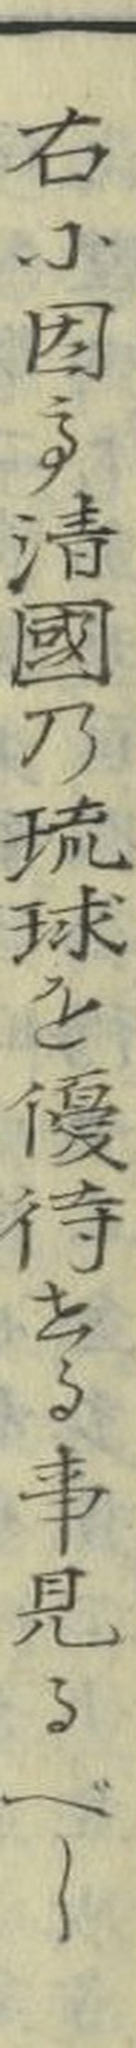右に因て清国の琉球を優待せる事見るべし
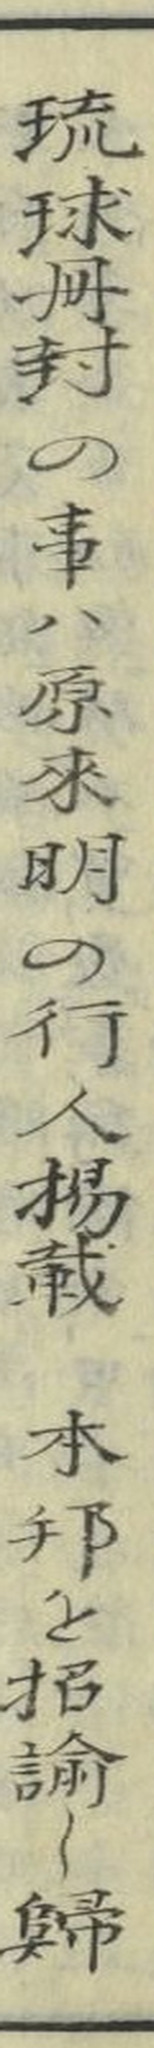琉球冊封の事は原来明の行人揚載本邦を招諭し帰
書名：琉球沿革志 下
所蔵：University of the Ryukyus Library
